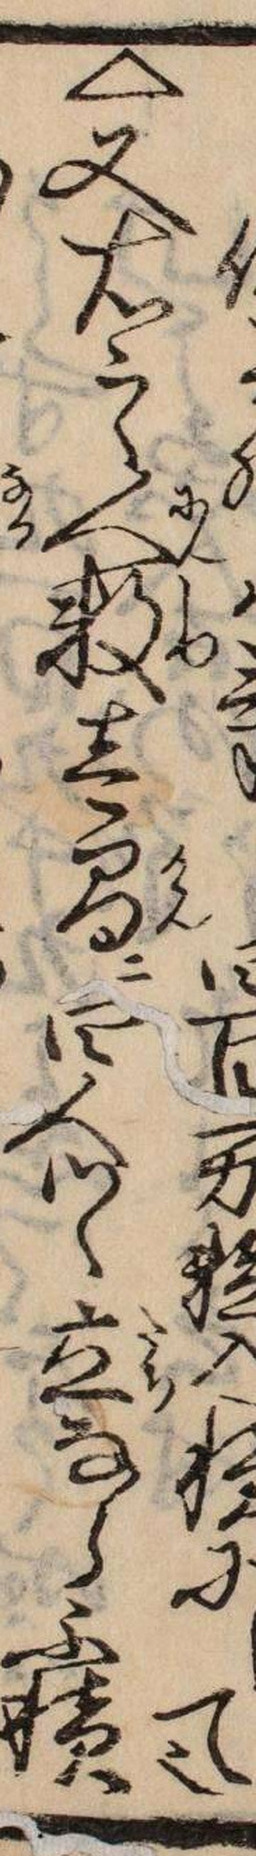△又右之人数壱間に四人つつ立ならふ積
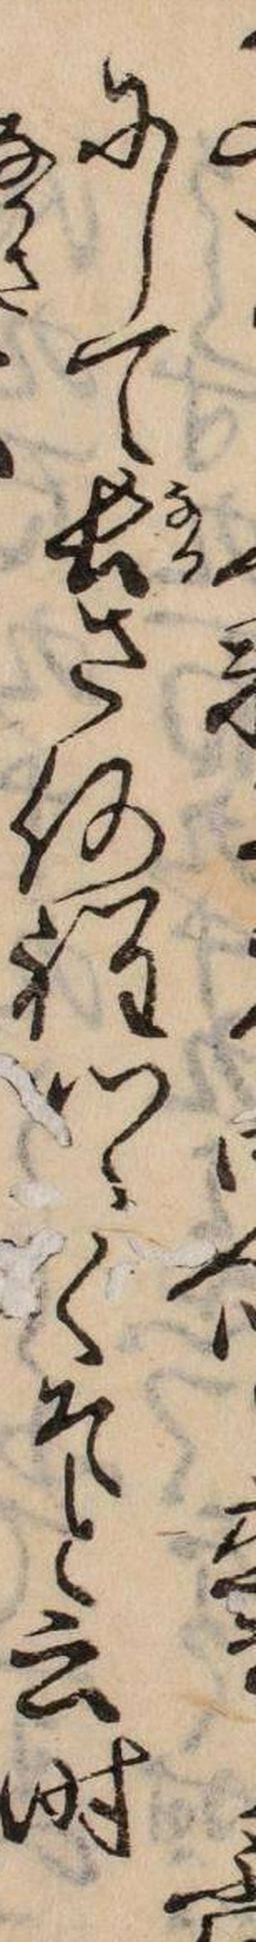にして長さ何程つつくそと云時
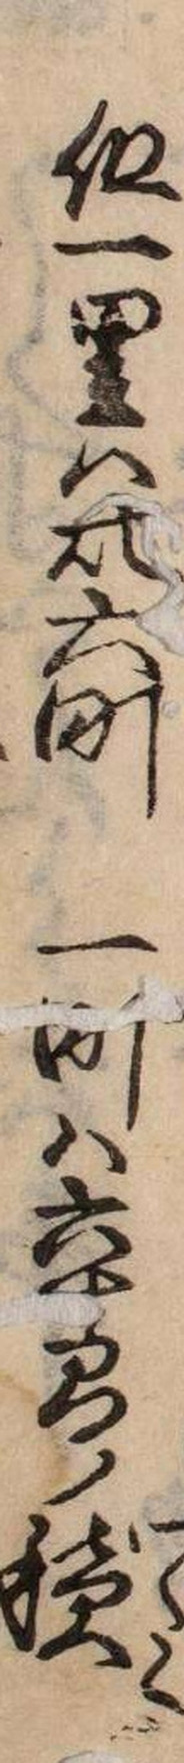但一里は廿六町一町は六間の積
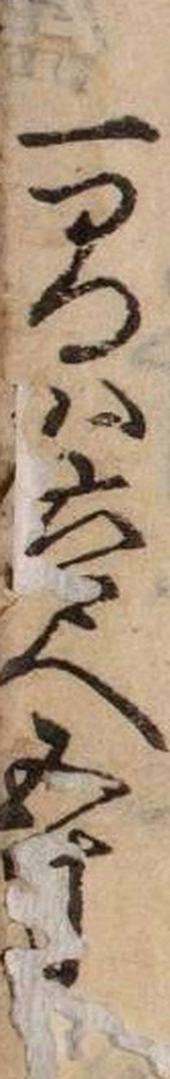一間は六尺五寸

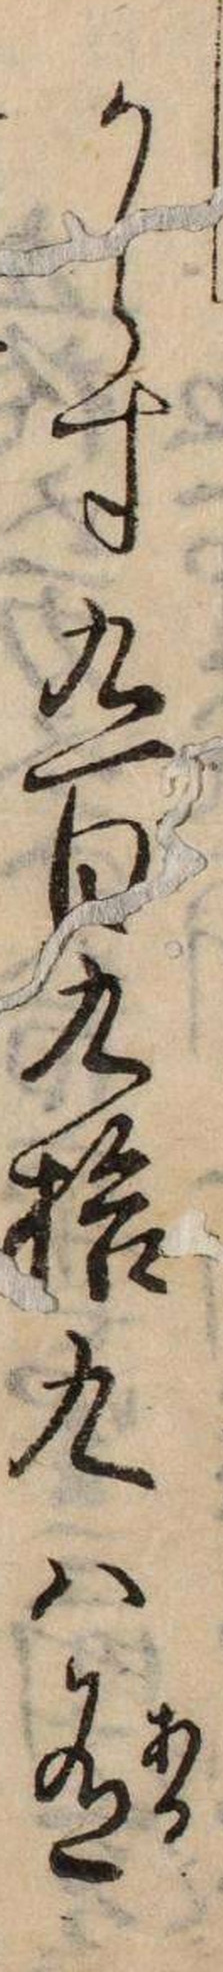からす九百九拾九は有
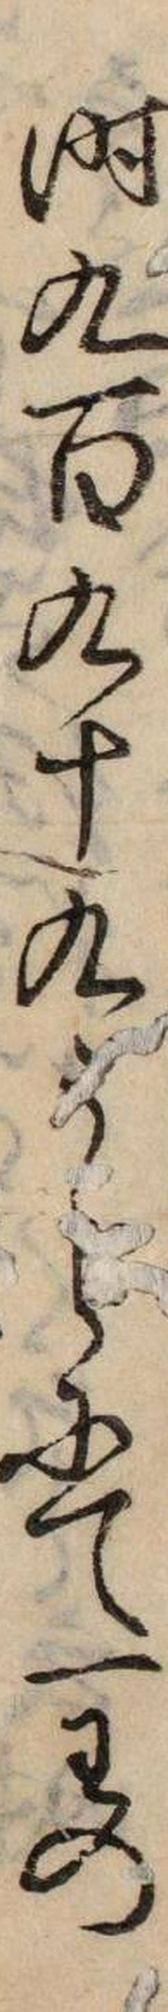時九百九十九うらにて一わの
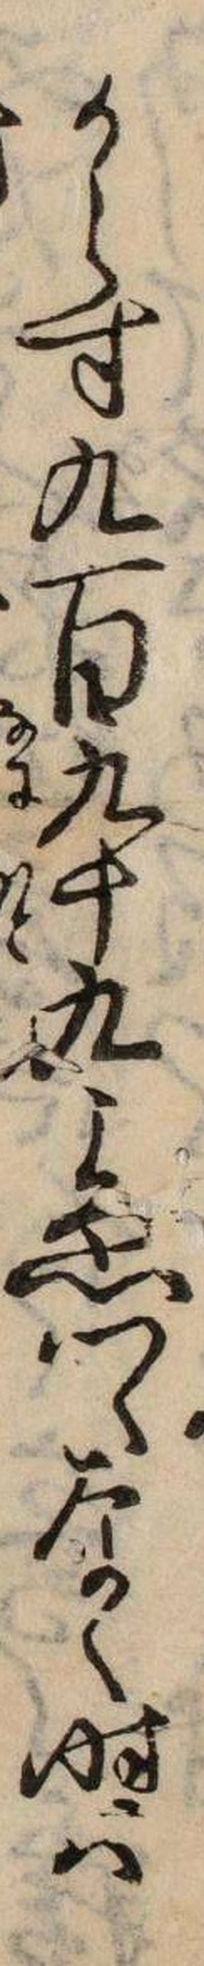からす九百九十九よゑつつなく時には
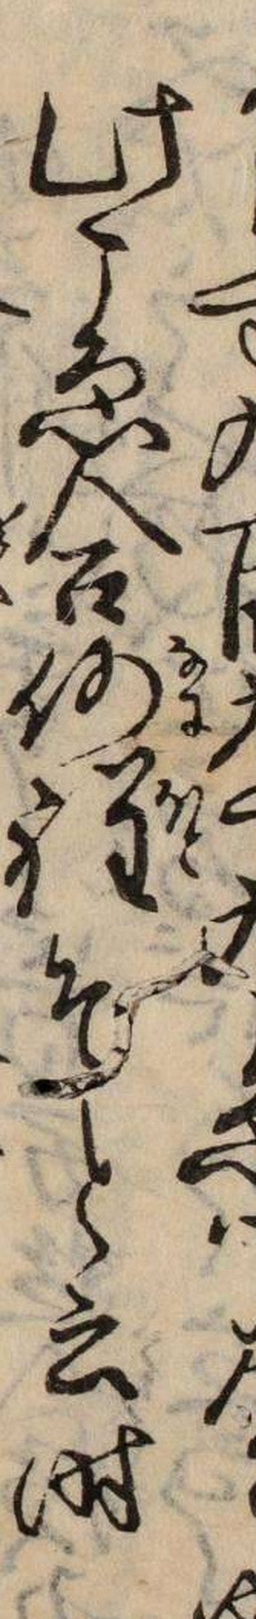此こゑ合何程そと云時
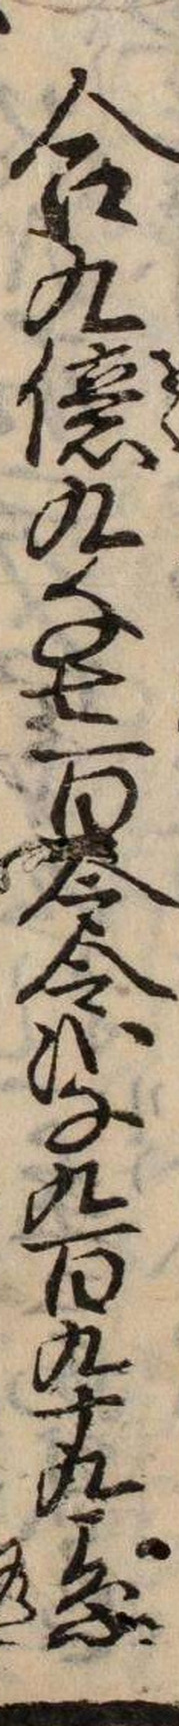合九億九千七百令令弐千九百九十九こゑ
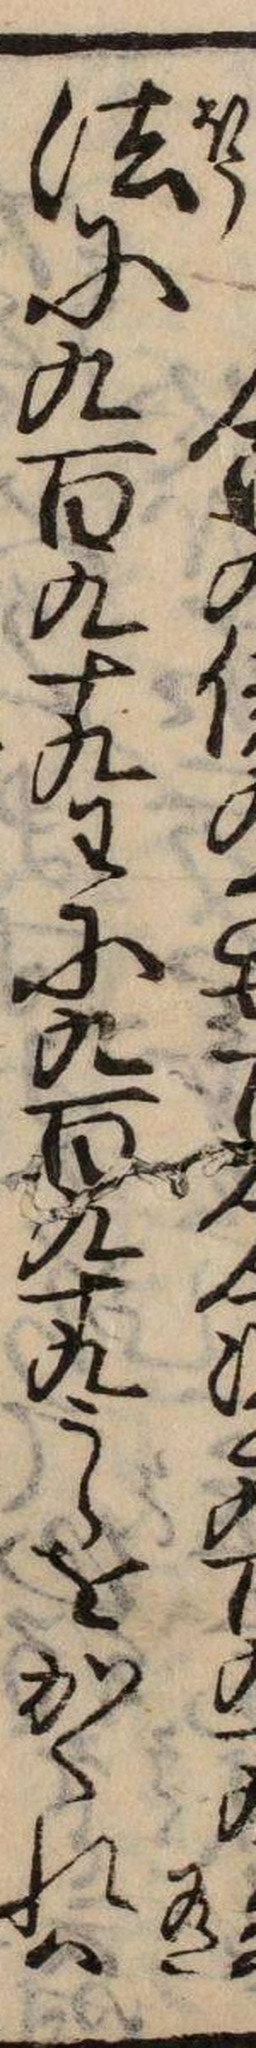法に九百九十九わに九百九十九うらをかくれは
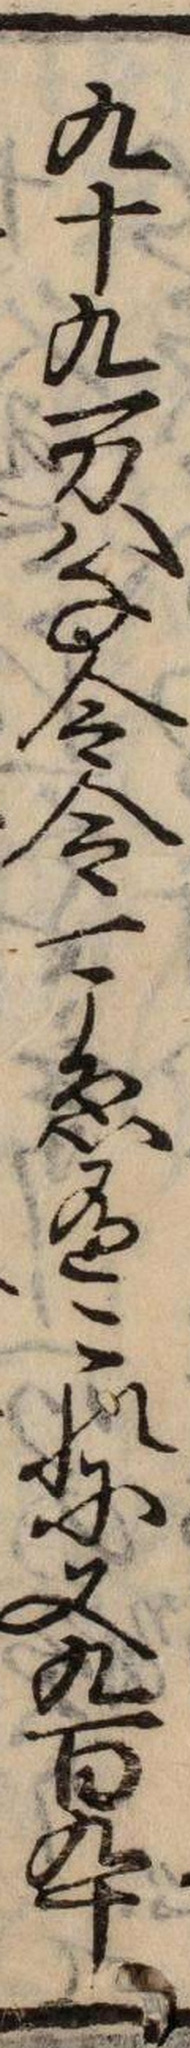九十九万八千令令一こゑ有これに又九百九十
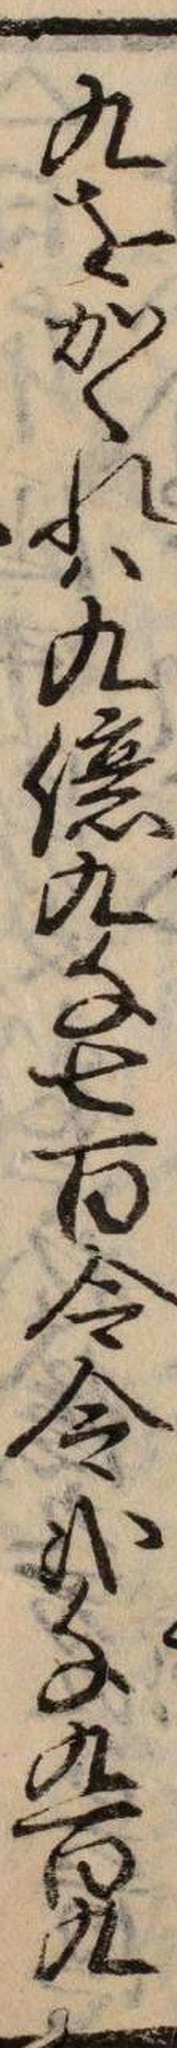九をかくれは九億九千七百令弐千九百九
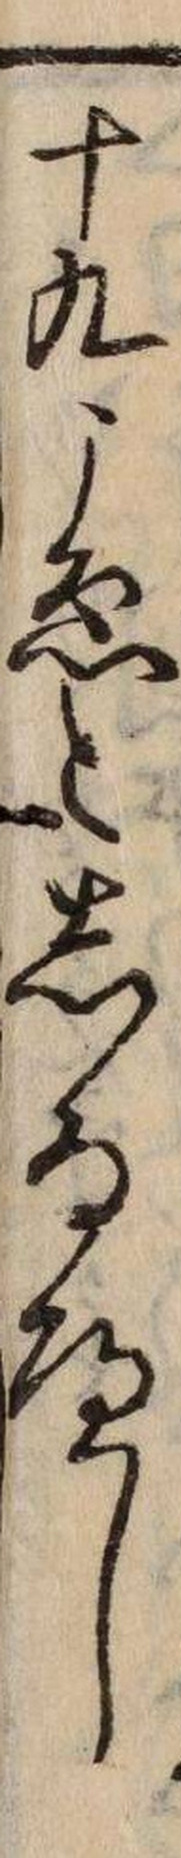十九こゑとしるへし
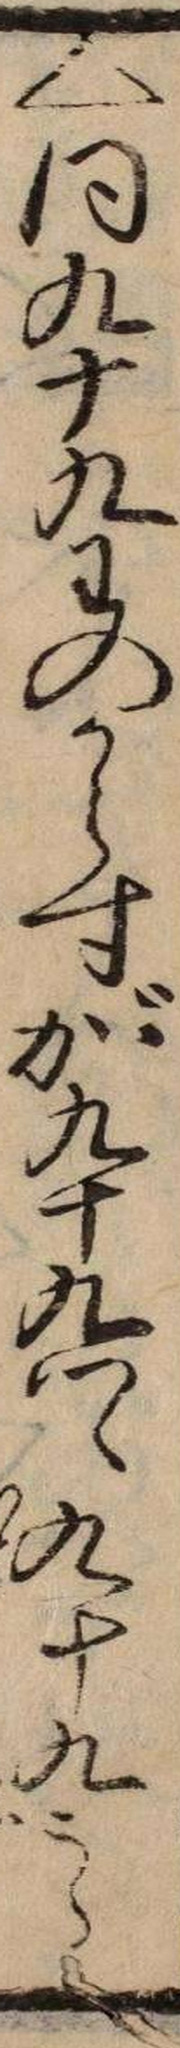△同九十九わのからすが九十九つつ九十九うら
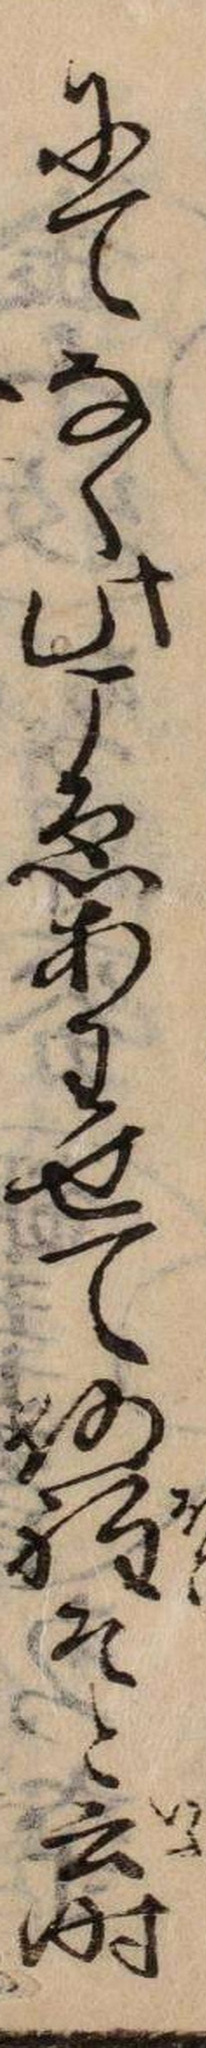にてなく此こゑあわせて何程そと云時
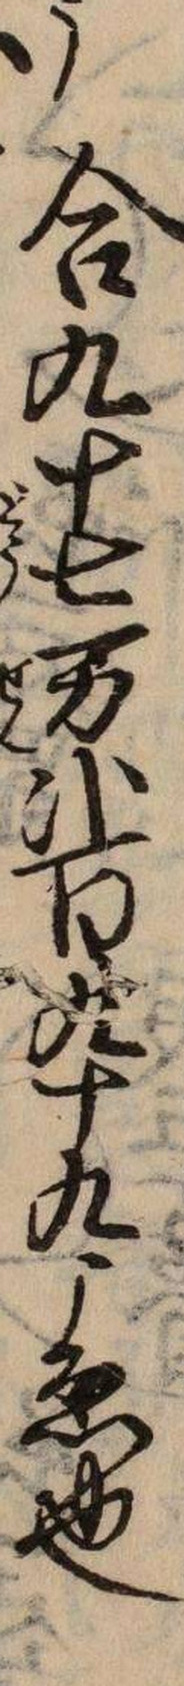合九十七万弐百九十九こゑ也
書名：塵劫記（寛永11年自跋、京都府立京都学・歴彩館追貴8）
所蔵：京都府立京都学・歴彩館 国文学研究資料館
